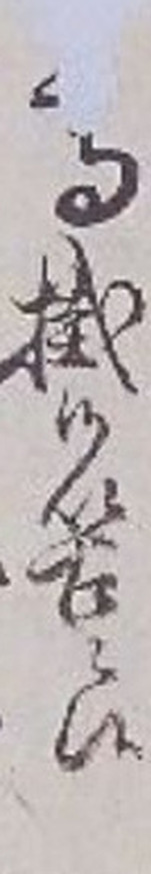其高掛候筈に候
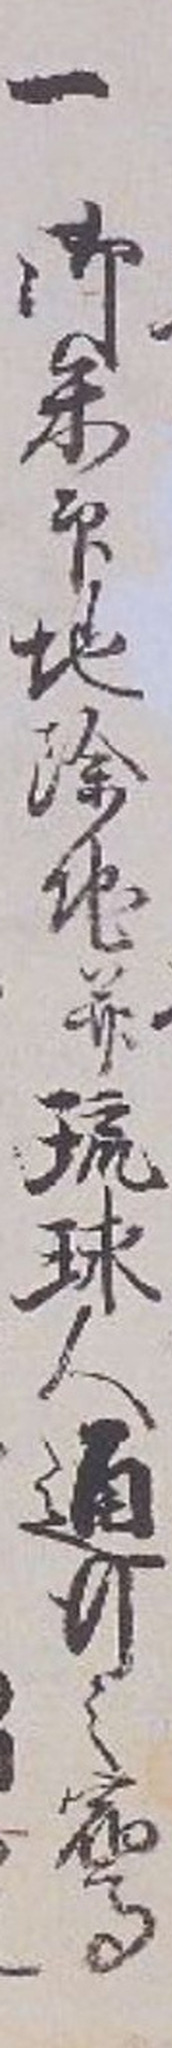一御朱印地除地幷琉球人通行之宿高
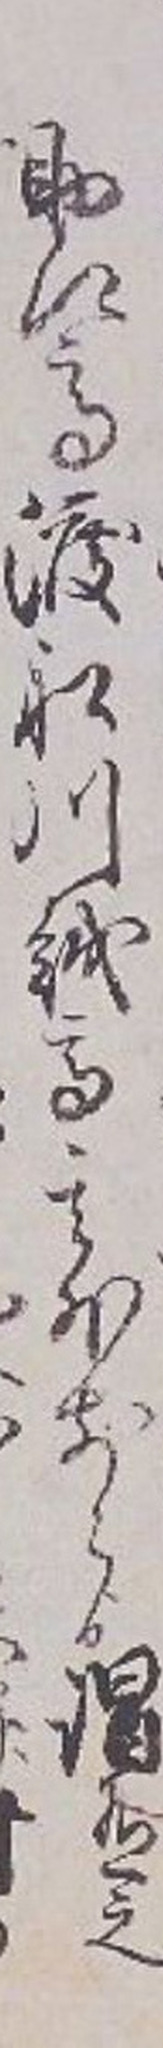助郷高渡船川越高其外前々ゟ謂有之
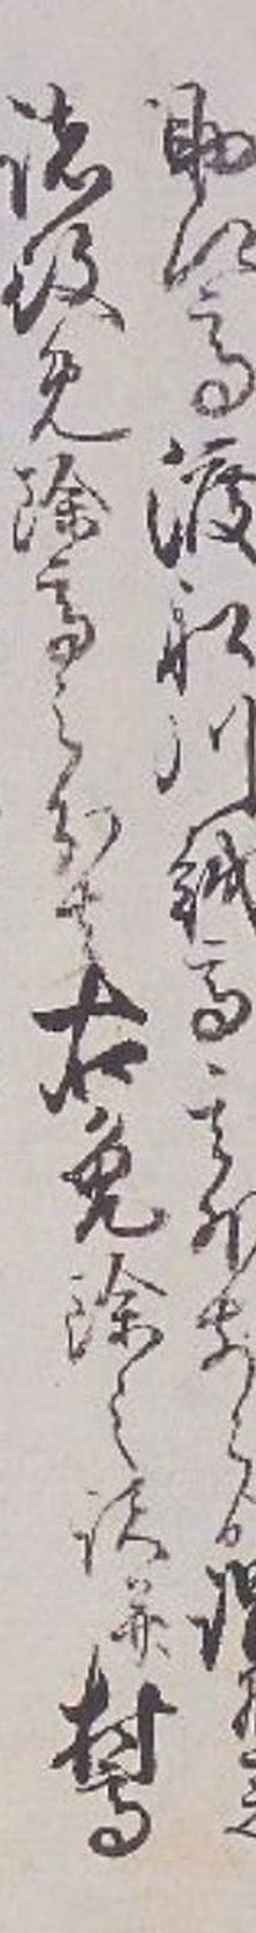諸役免除高之分者右免除之訳幷村高
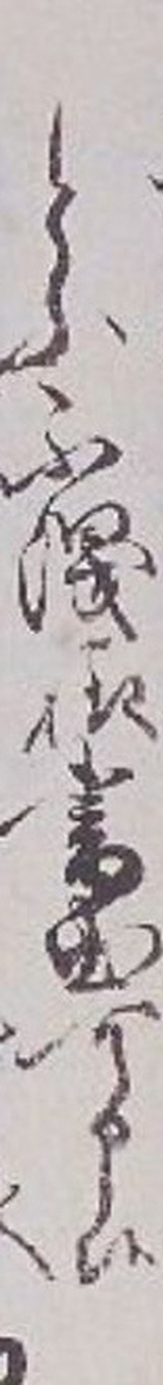とふ不洩御書出可申候
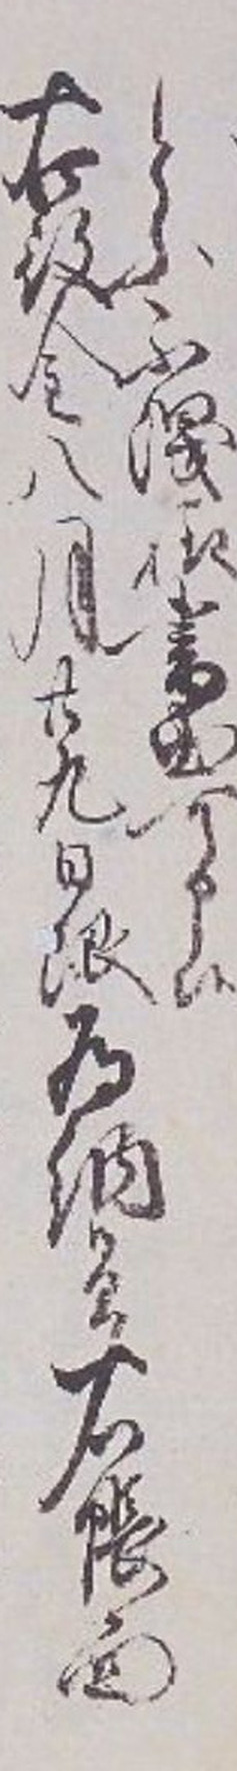右役金八月廿九日限為納候間右帳面
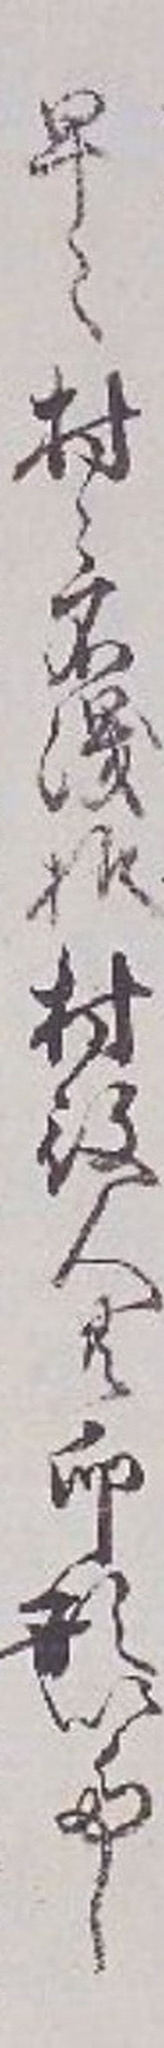早々村々不洩様村役人共印形いたし
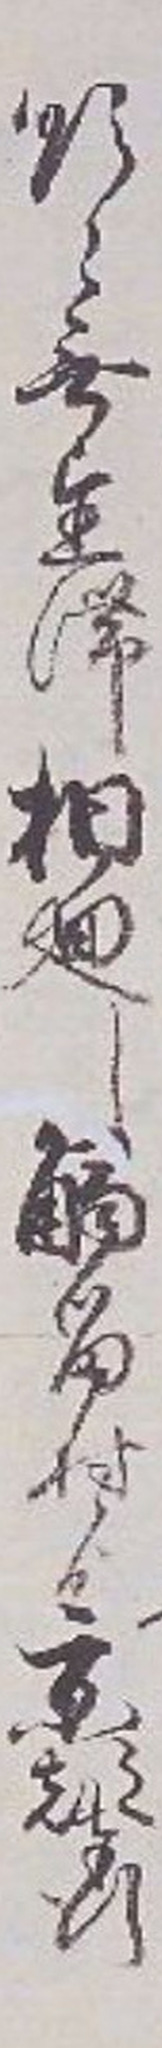順々無遅滞相廻し触留村ゟ京都奉行
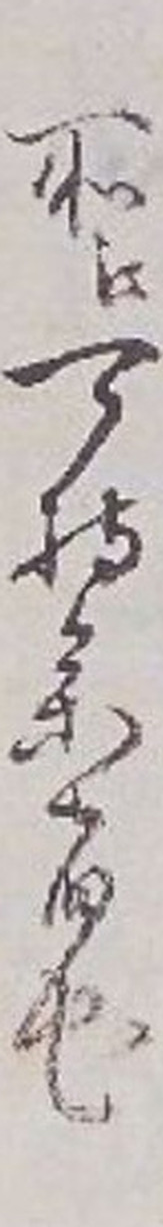所え可持参者也
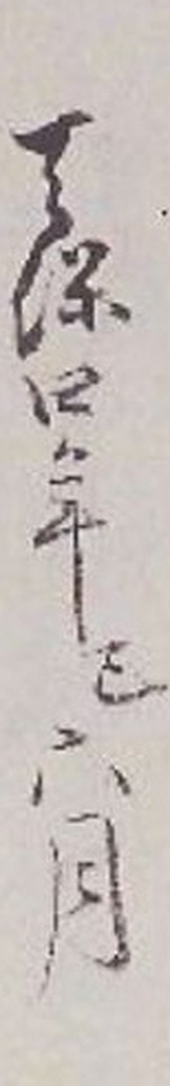天保四年巳六月
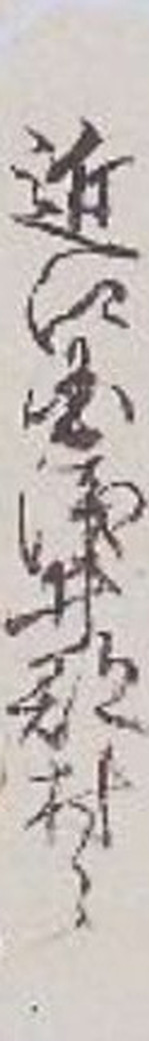近江国浅井郡村々
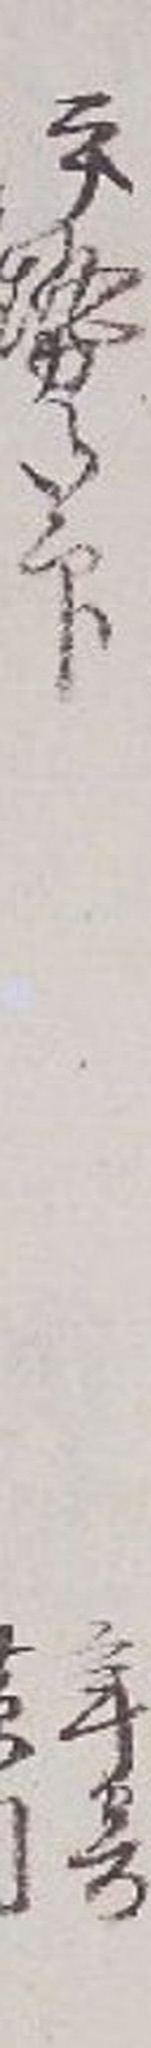伊勢御印年寄
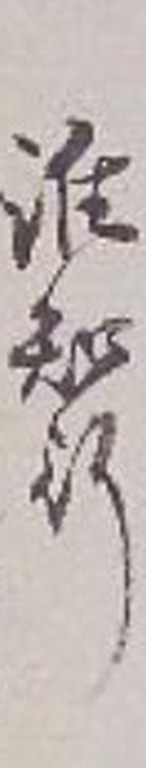誰知行
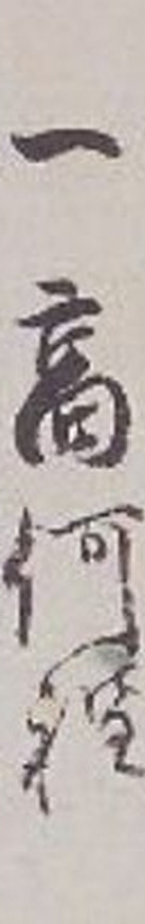一高何程
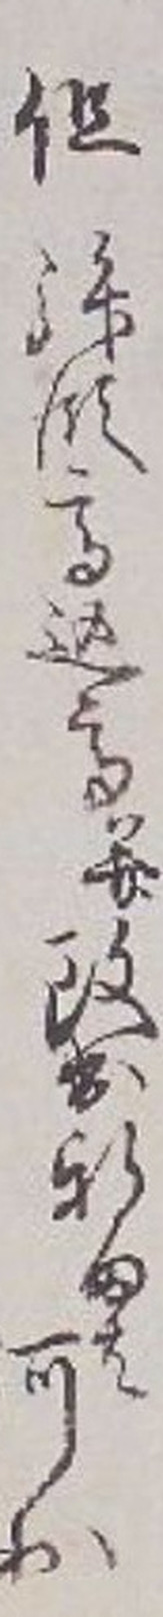但拝領高込高幷改出新田共
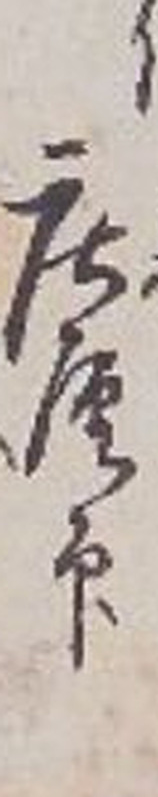庄屋印
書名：琉球人帰国に付国役金の記録
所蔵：University of the Ryukyus Library
